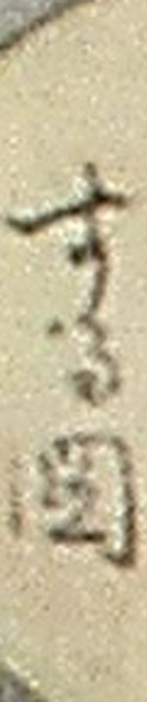する図
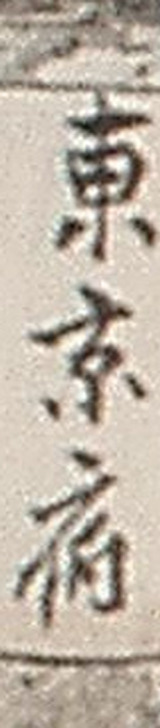東京府
